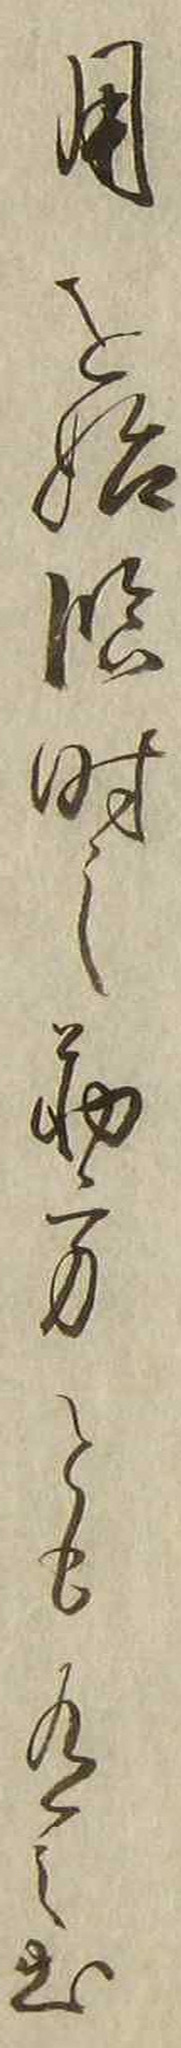用を始臨時之勤方とも有之出

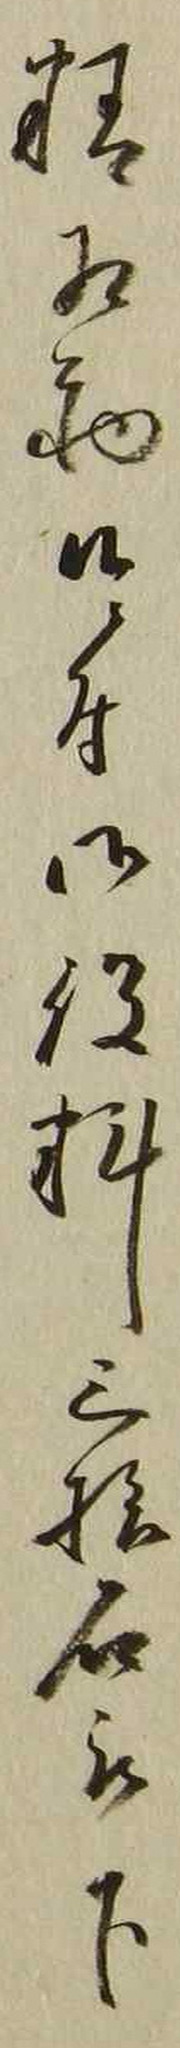精相勤候ニ付御役料三拾石被下
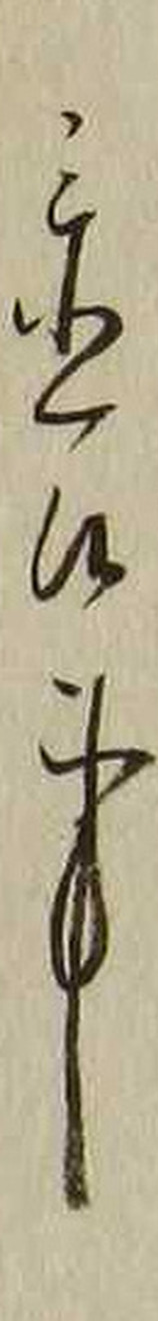置候事
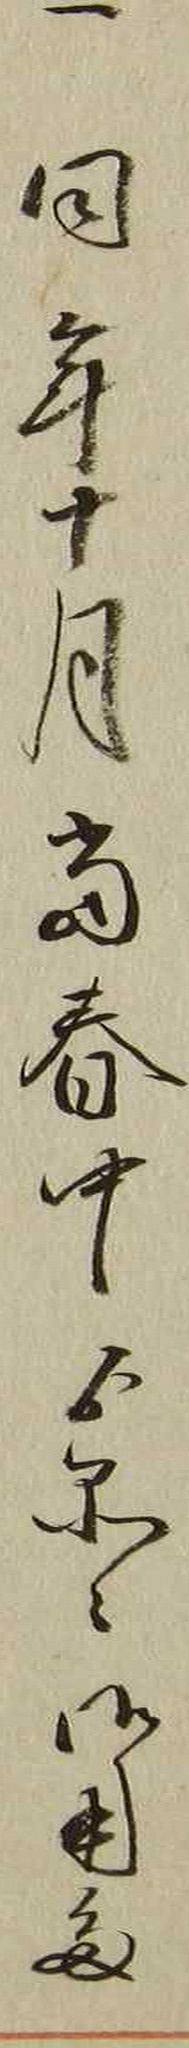一同年十月当春中ゟ所々御用多
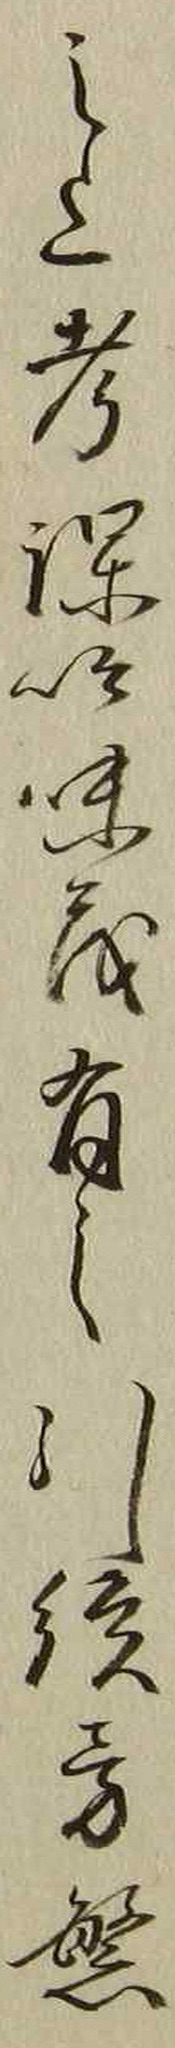之上考深吟味茂有之引続旁繁
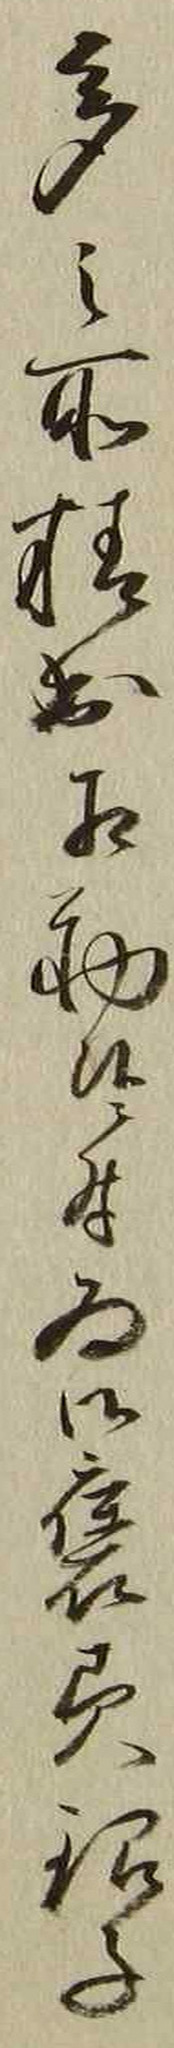多之所精出相勤候ニ付為御褒美銀子
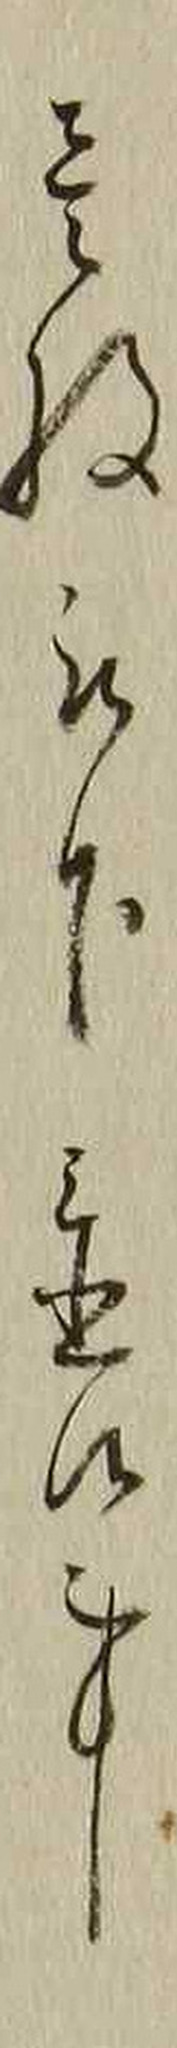壱枚被下置候事
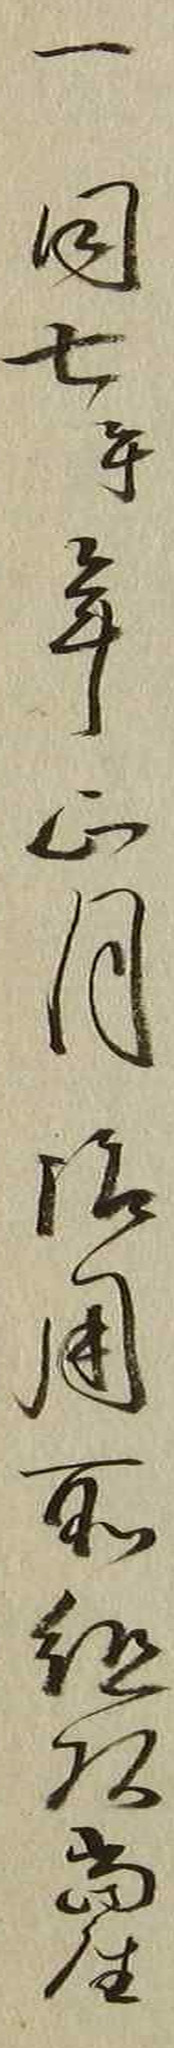一同七午年正月御用所組頭当座
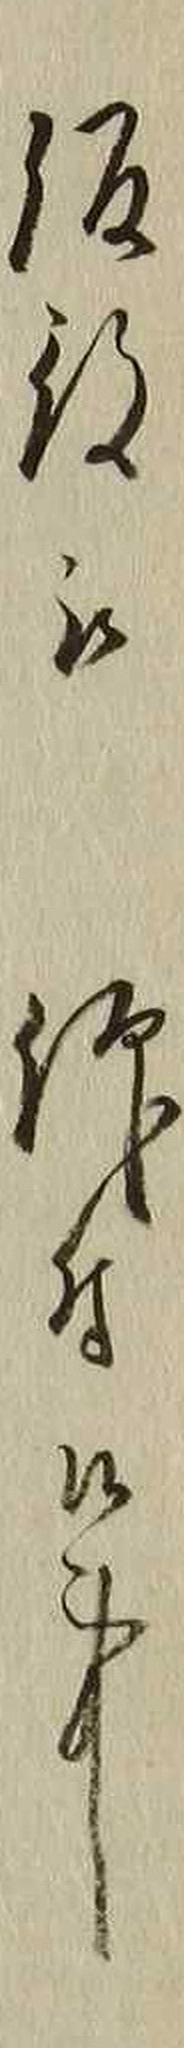仮役被仰付候事
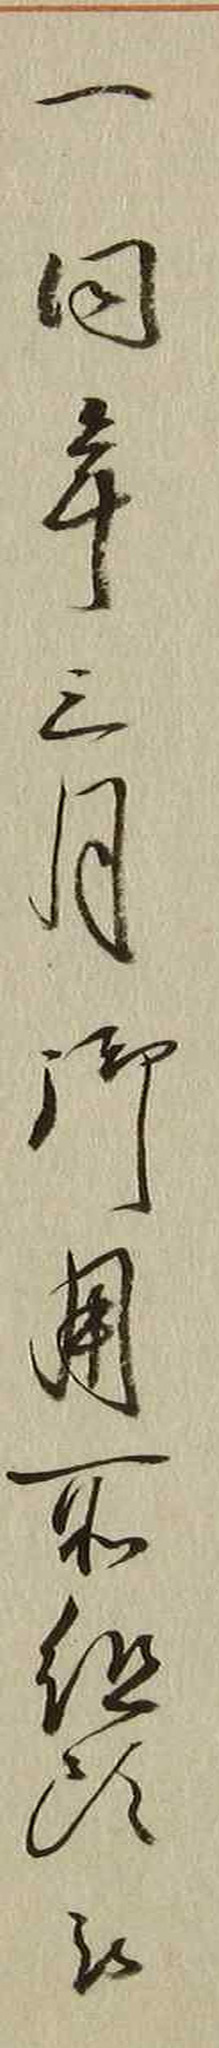一同年三月御用所組頭被
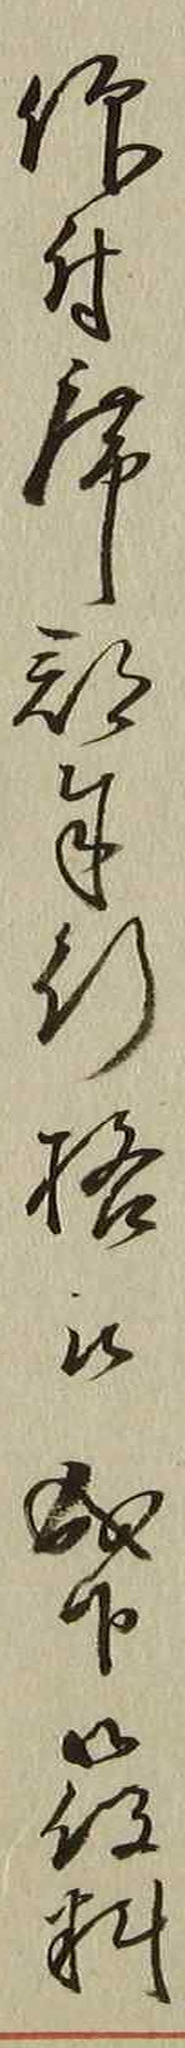仰付席郡奉行挌被成下御役料
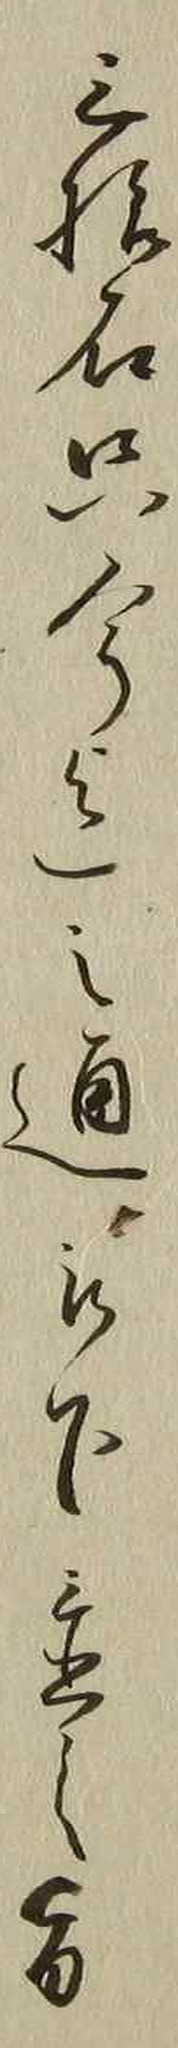三拾石只今迄之通ニ下置之旨
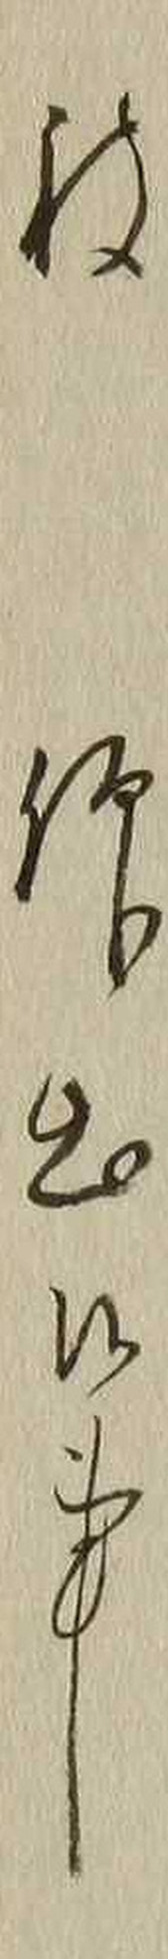被仰出候事
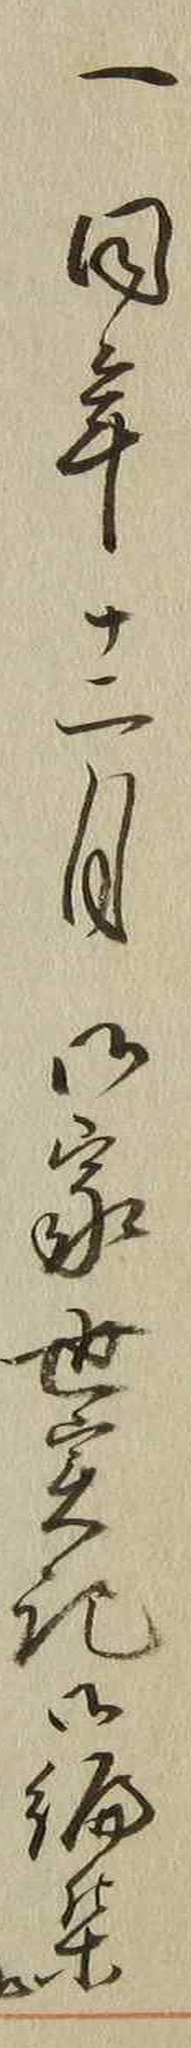一同年十二月御家世実記御編集御
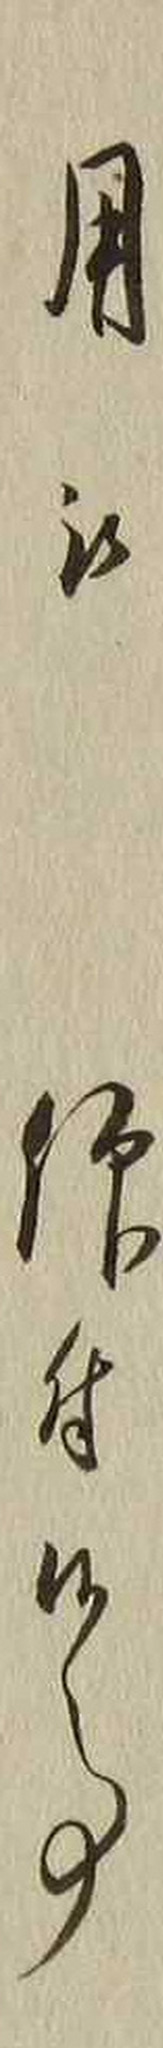用被仰付候事
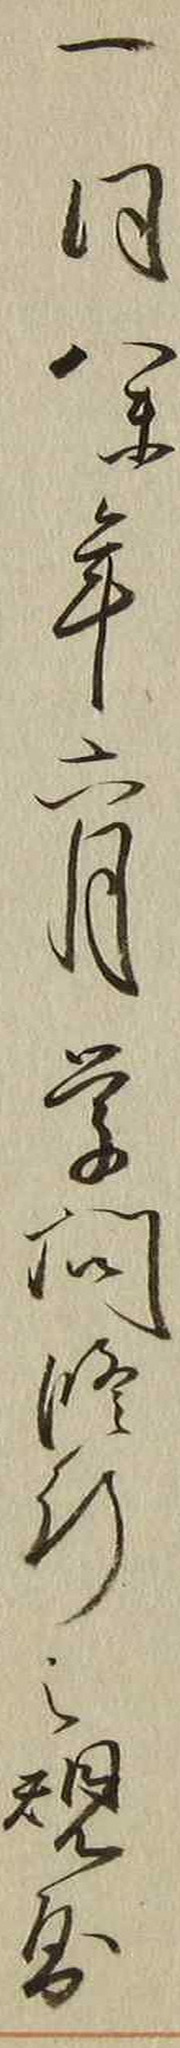一同八未年六月学問修行之規則
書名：諸士系譜　巻之68　を之部2
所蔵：会津若松市立会津図書館
